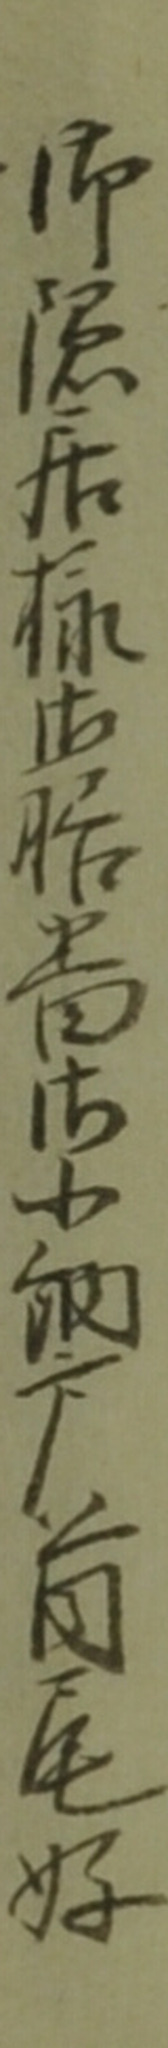御隠居様御膳番御小納戸首尾好
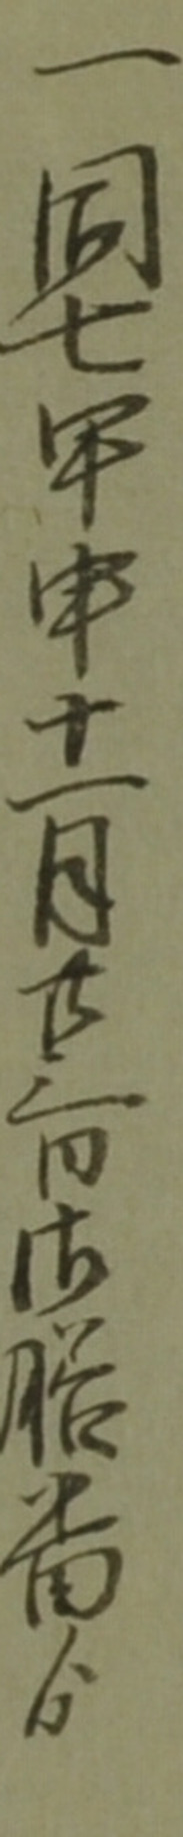一同七甲申十一月廿三日御膳番ゟ
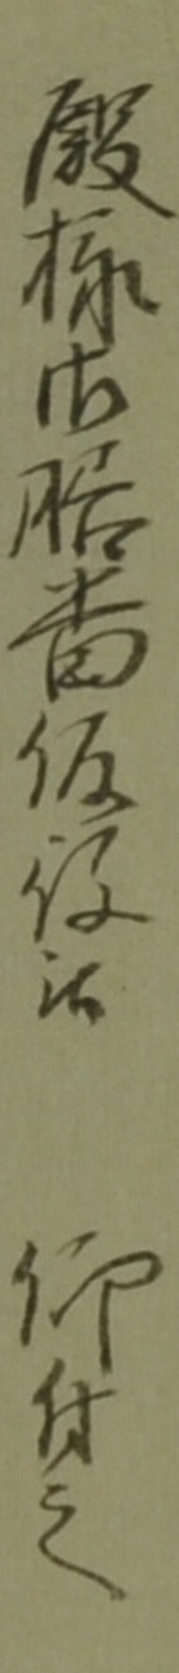殿様御膳番仮役被仰付之
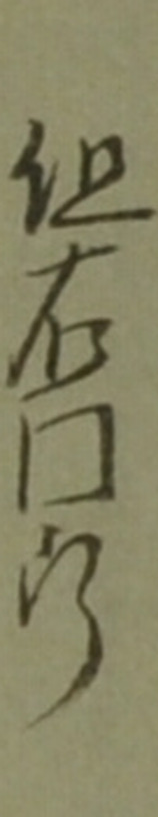但右同断
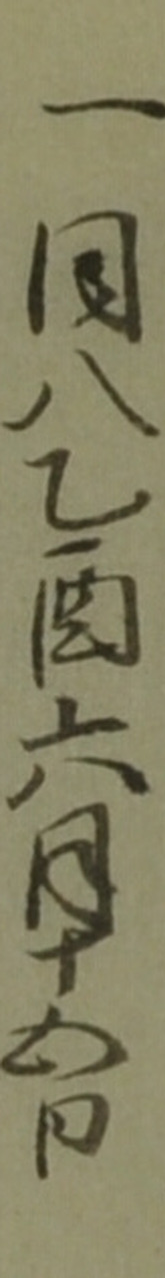一同八乙酉六月十五日
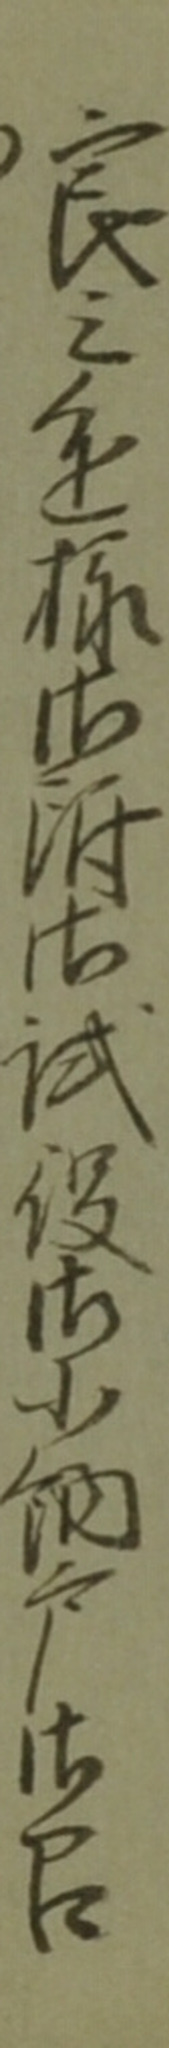良之進様御附御試役御小納戸御召
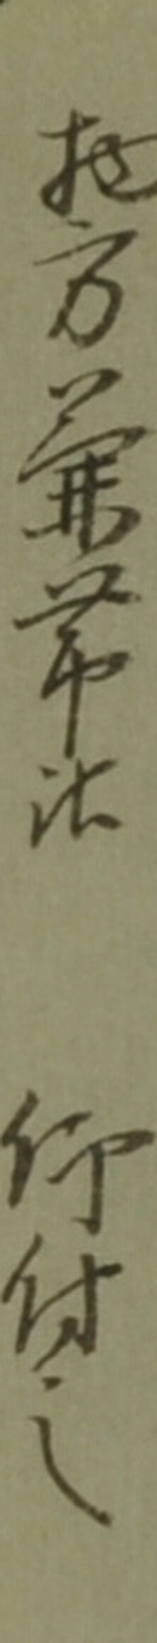物方兼帯被仰付之
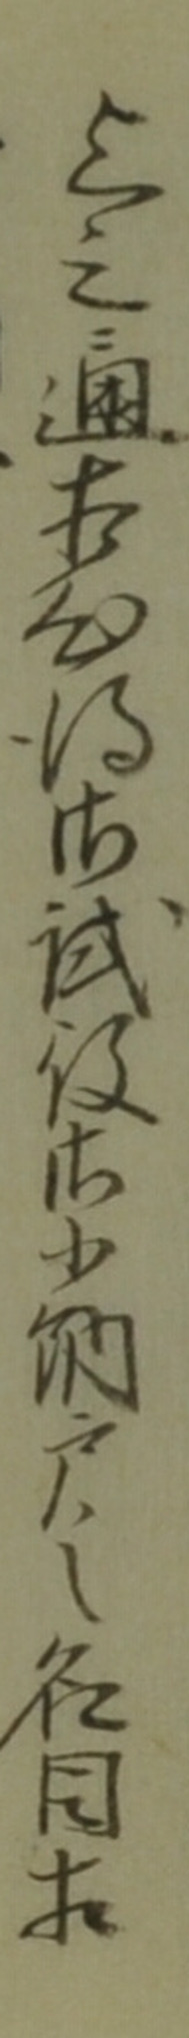迄之通相心得御試役御小納戸之名目相
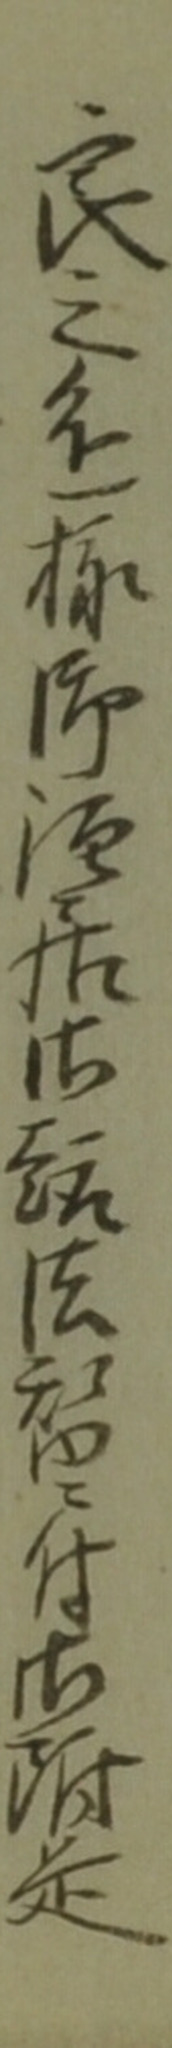良之進様御住居御趣法替ニ付御附是
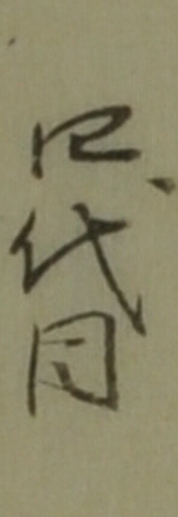四代目
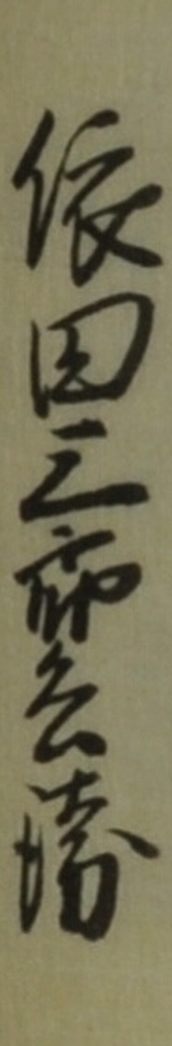依田三郎兵衛
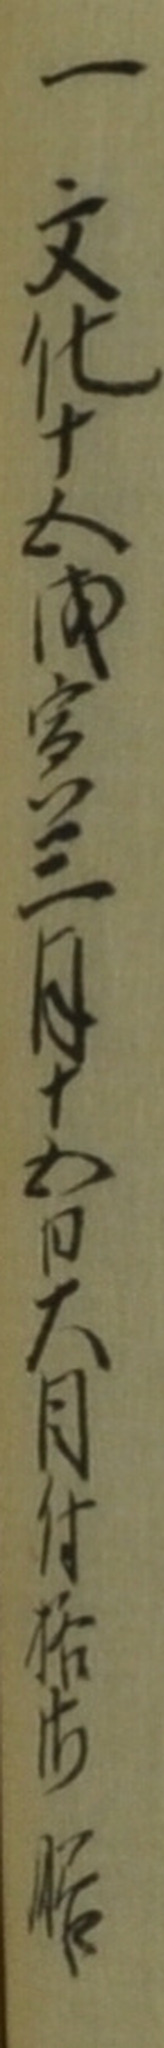一文化十五戊寅三月十五日大目付格御膳
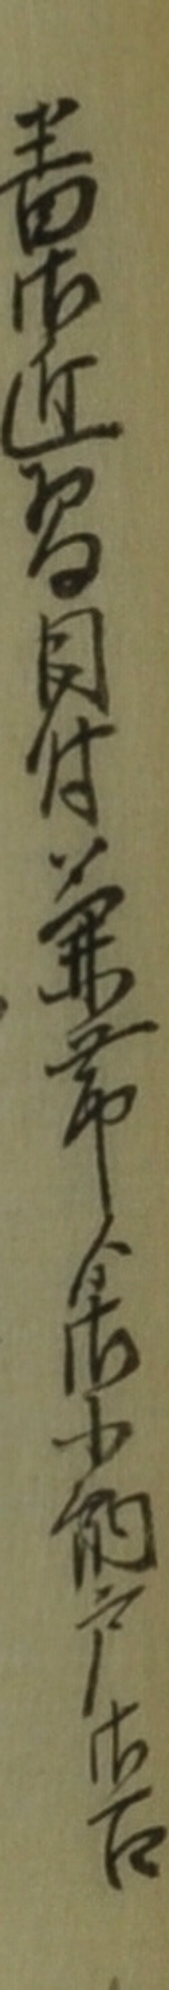番御近習目付兼帯ゟ御小納戸御召
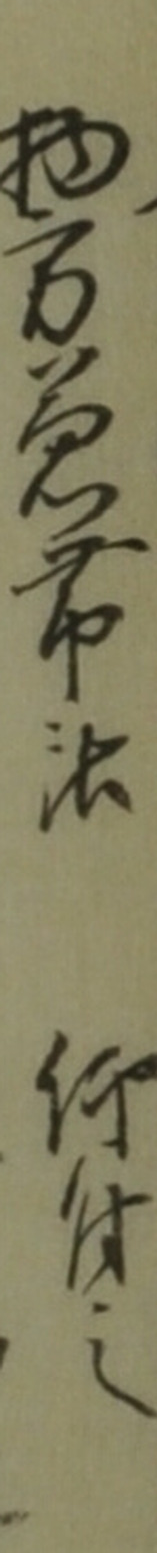物方兼帯被仰付之
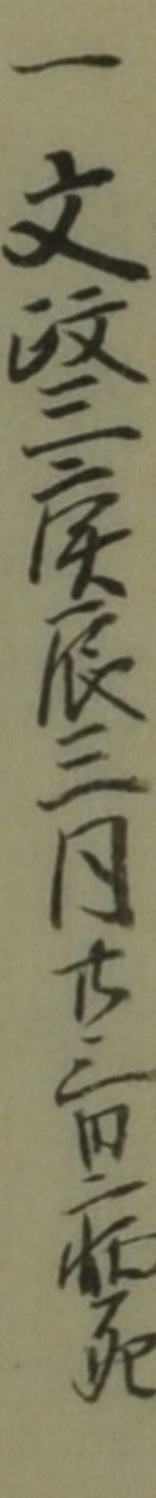一文政三庚辰三月廿三日病死
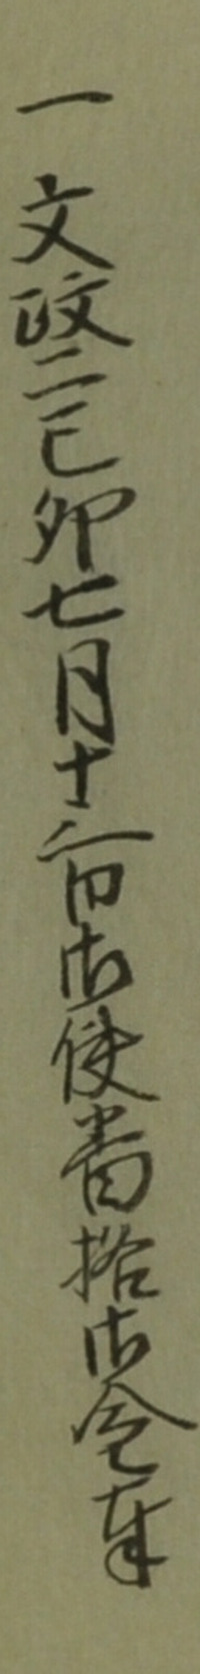一文政二己卯十三日御使番格御金奉
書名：諸御役代々録（四）
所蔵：伊那市立高遠町図書館・合同会社AMANE
